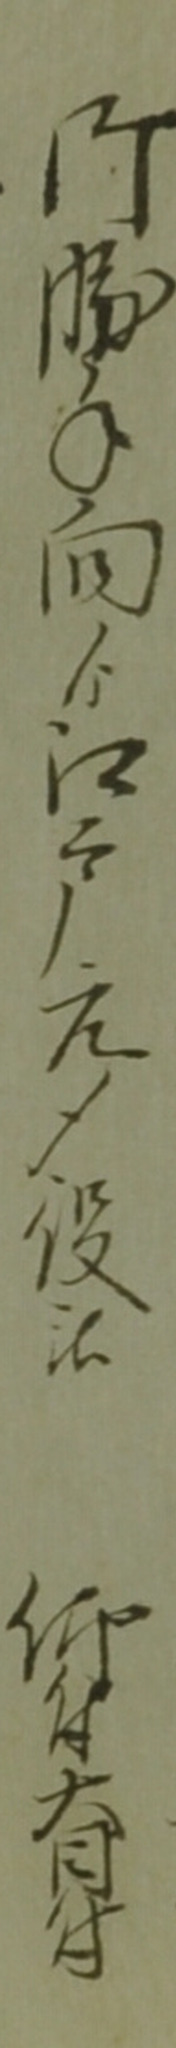御勝手向ゟ江戸元〆役被仰付大目付
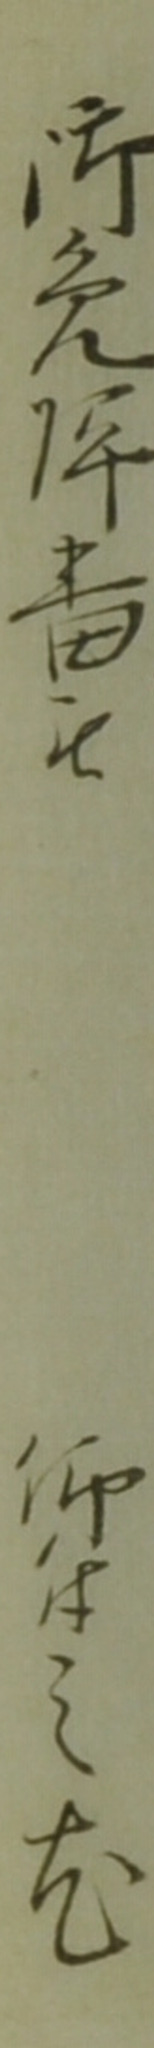御免帰番被仰付之尤

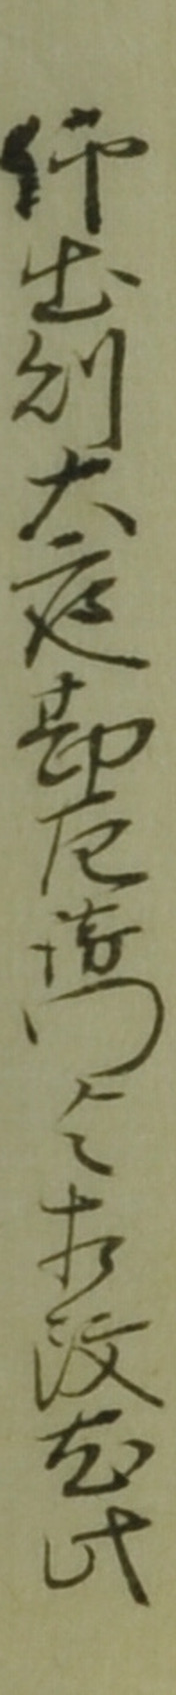仰出則大庭勘左衛門と相改尤此
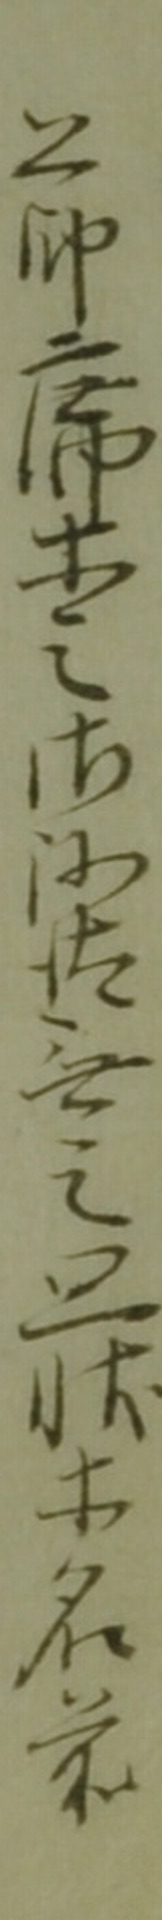説席等之御沙汰無之廻状等名前
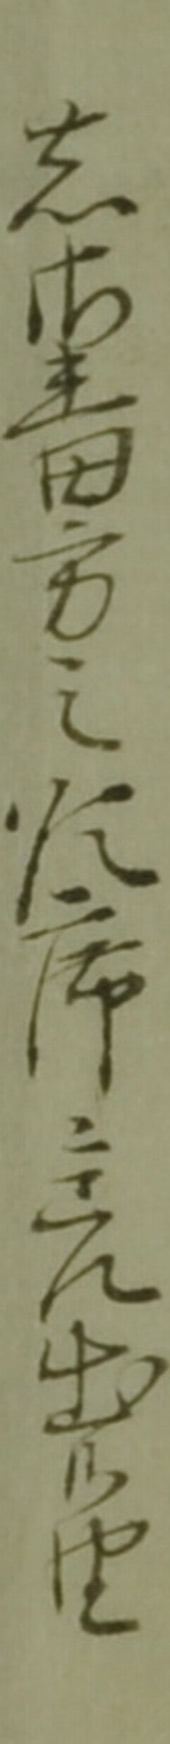者御番方之次席差出候由
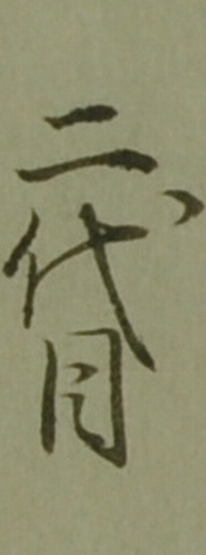二代目
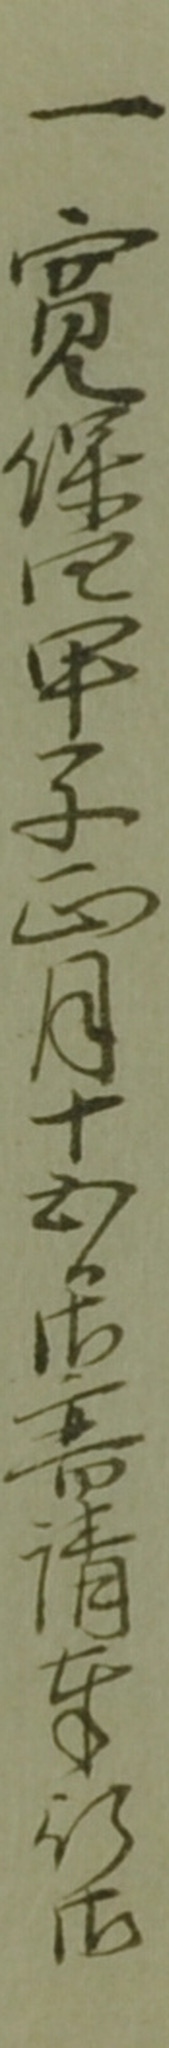一寛保四甲子正月十五日御普請奉行御
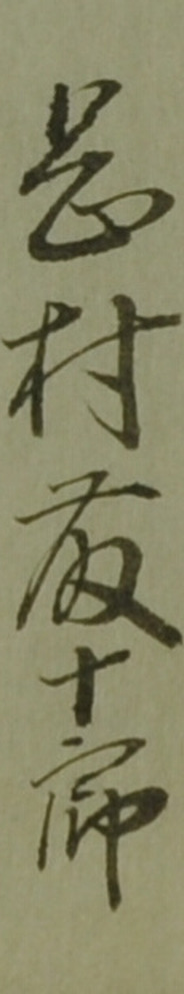岡村藤十郎
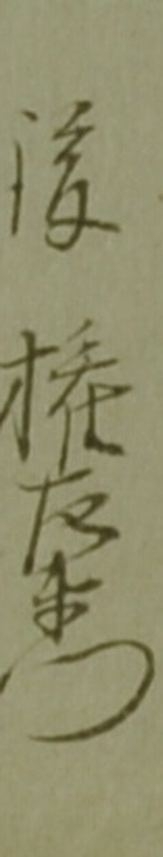後権左衛門
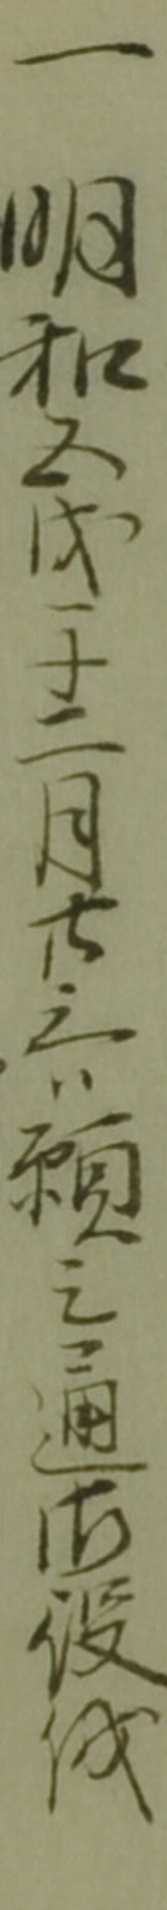一明和五戊子二月廿三日願之通御役儀
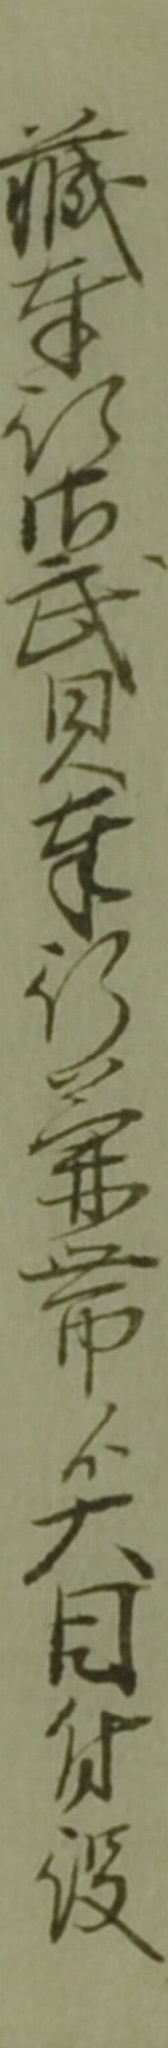蔵奉行御武具奉行兼帯ゟ大目付役
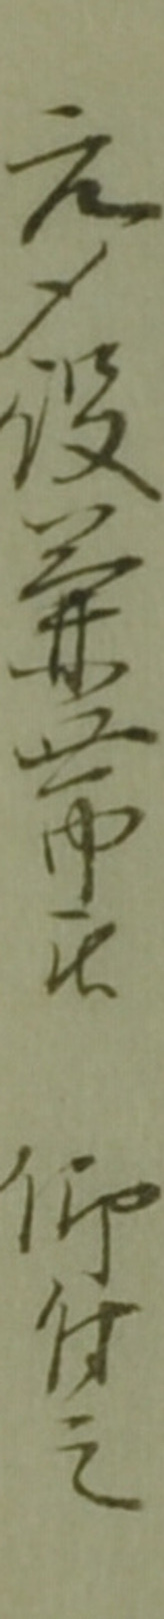元〆役兼帯被仰付之
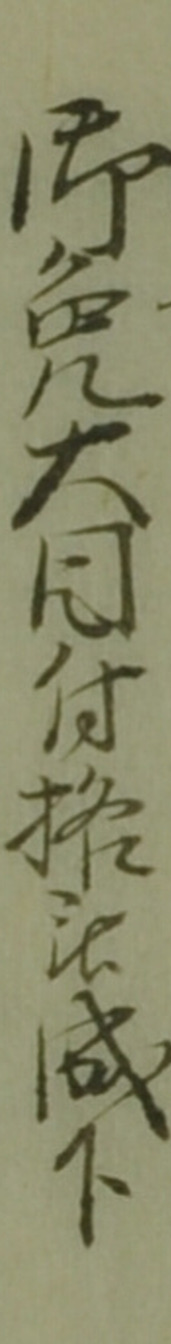御免大目付格被成下
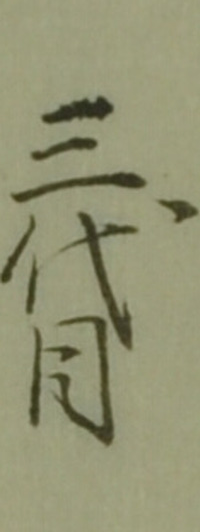三代目
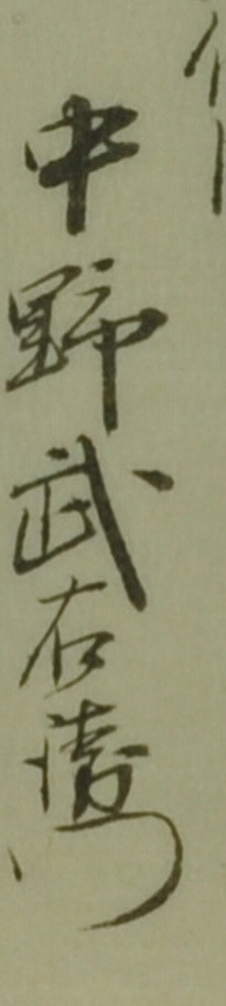中野武右衛門
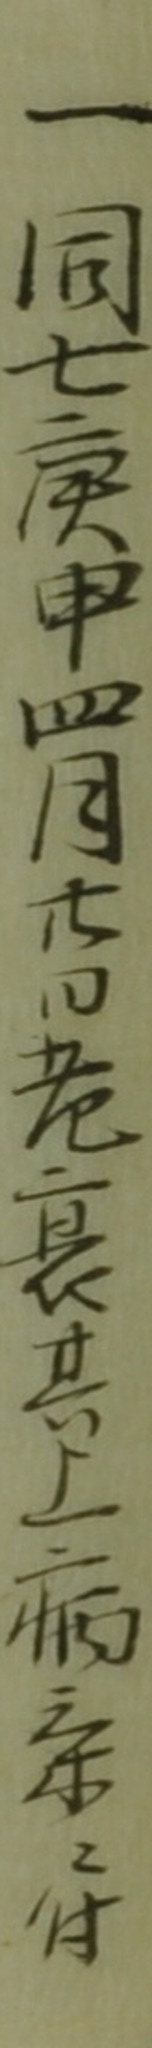一同七庚申四月廿日老衰其上病気付
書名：諸御役代々録（七）
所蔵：伊那市立高遠町図書館・合同会社AMANE
